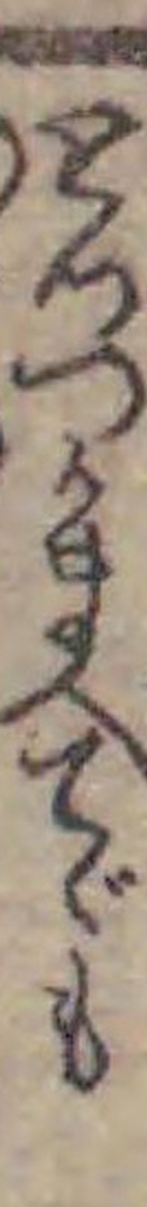とつつかまへてゞも
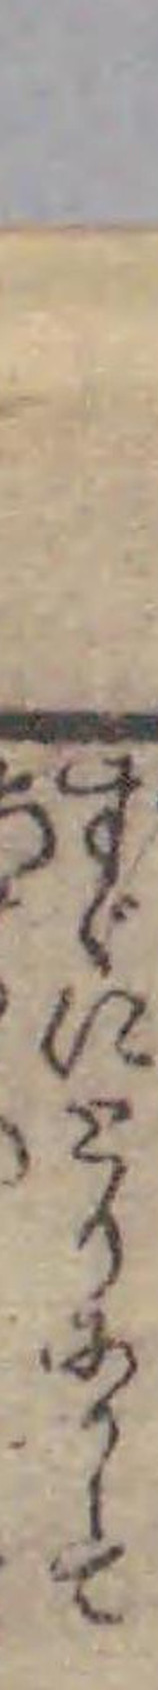すぐにとりにかして
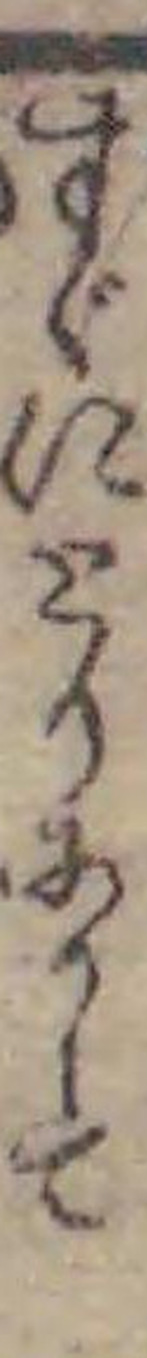すぐにとりにかして
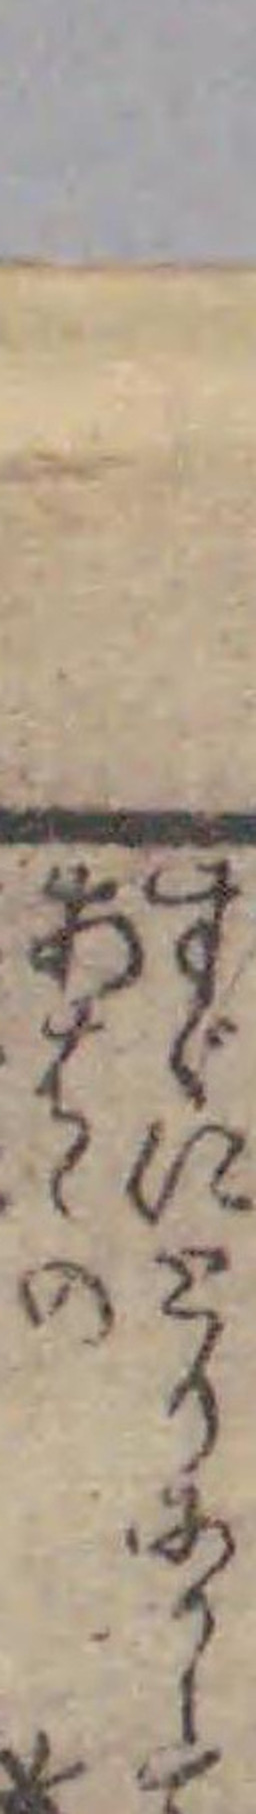あはゝの
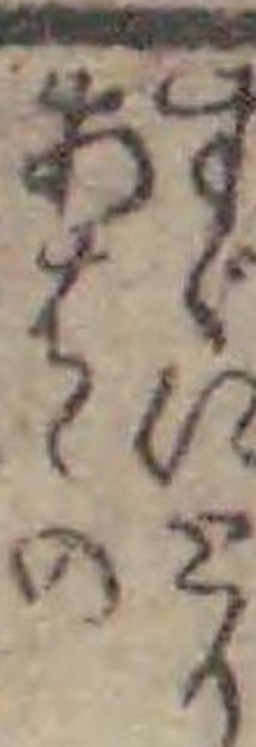あはゝの
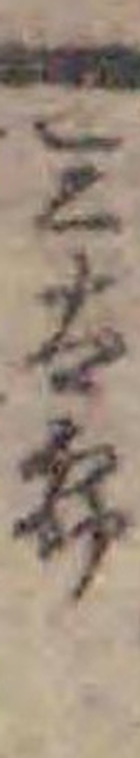三太郎
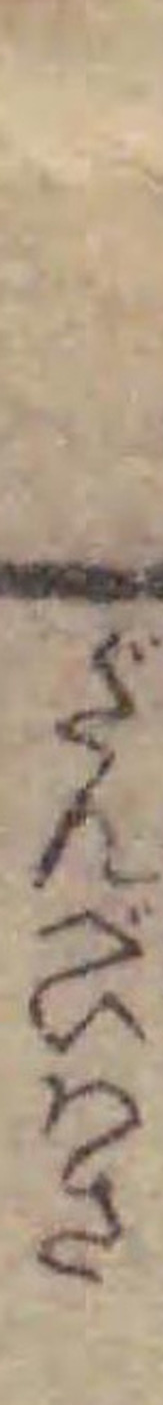だんべいはさ
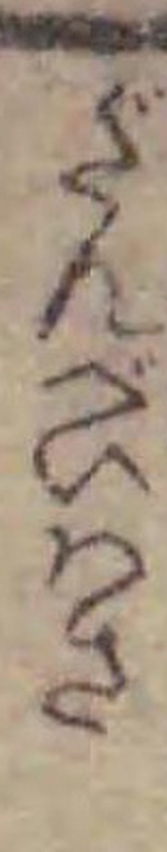だんべいはさ

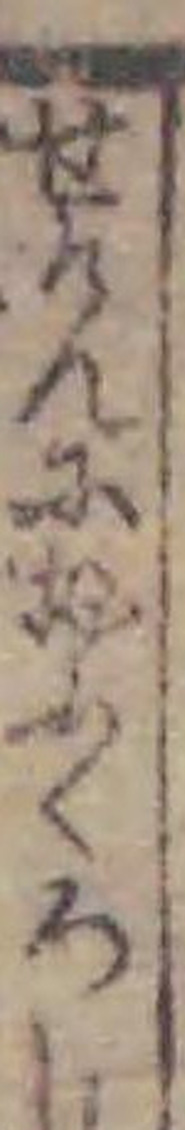せけんにおふくろ
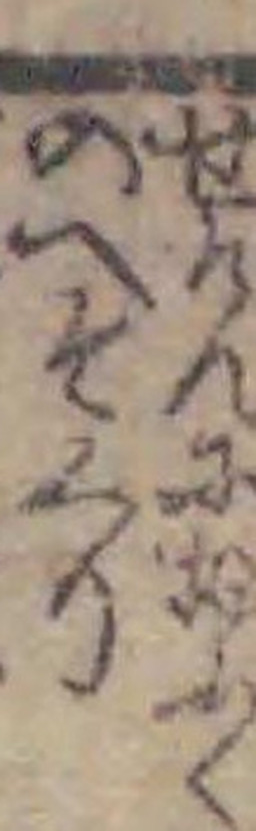のへそくり
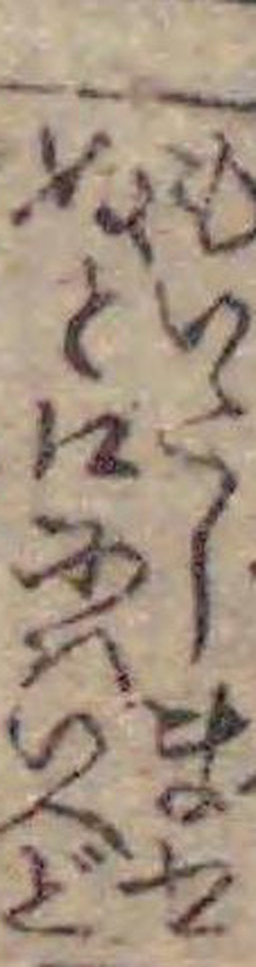ぬと口にはいへど
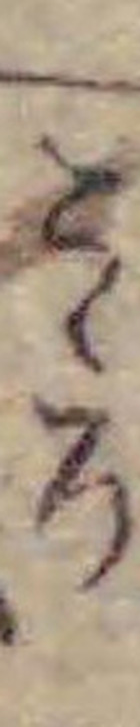こゝろ
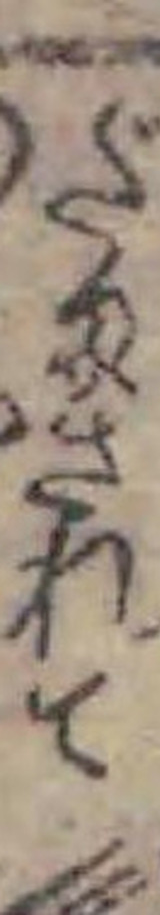だまされて
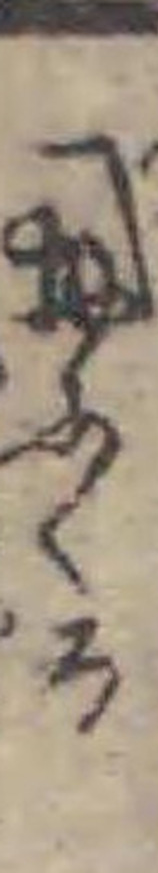〽おふくろ
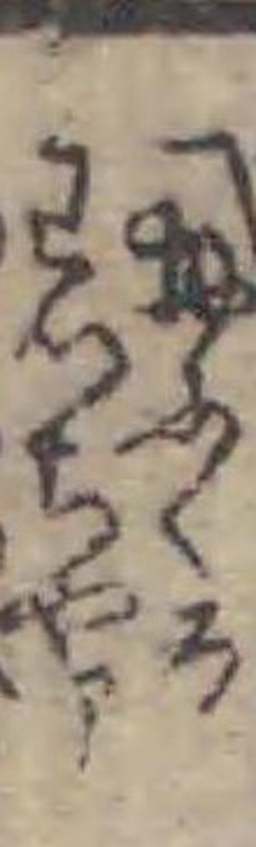わつちやァ
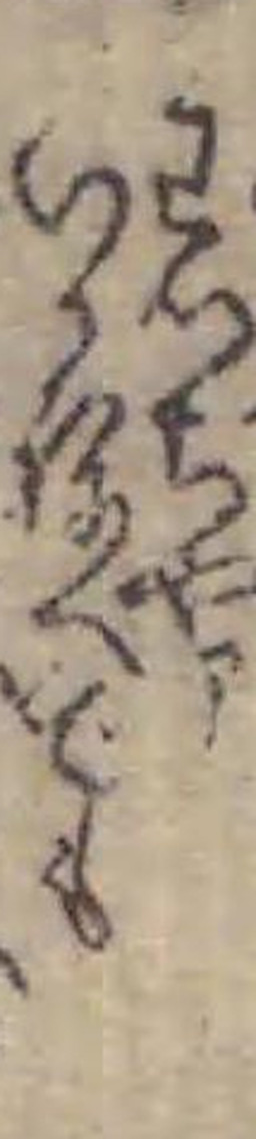かねへでも
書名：新鋳小判 : 3巻
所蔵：国立国会図書館 National Diet Library, JAPAN
